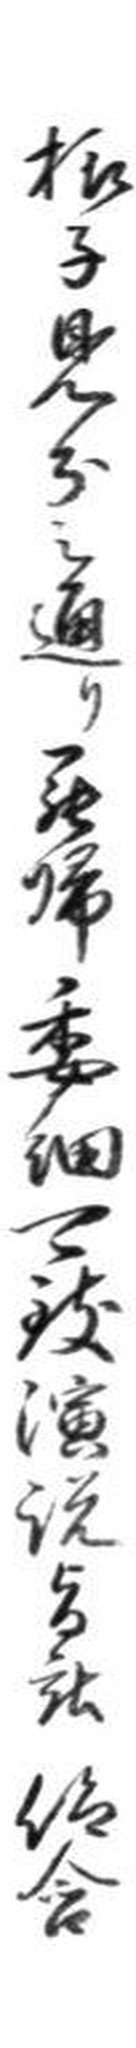様子見分之通り罷帰委細可致演説旨被仰含
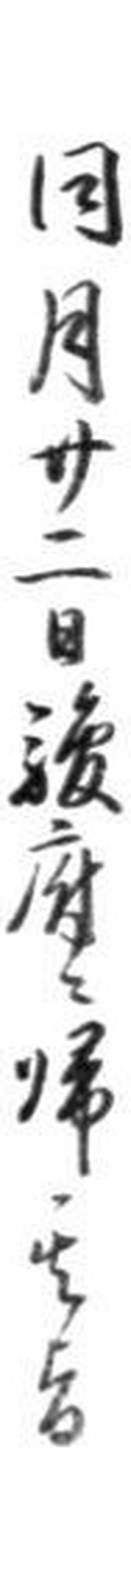同月廿二日駿府に帰其旨
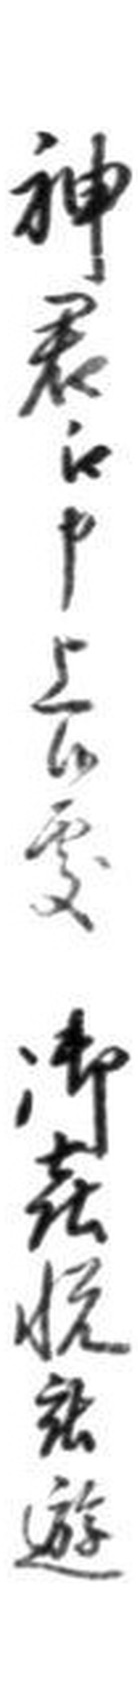神君江申上候処御喜悦被遊
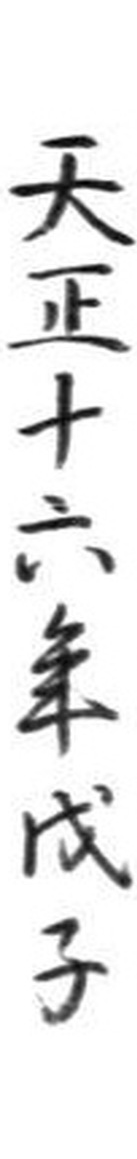天正十六年戊子
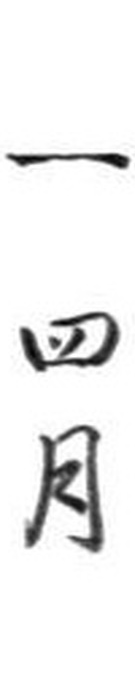一四月
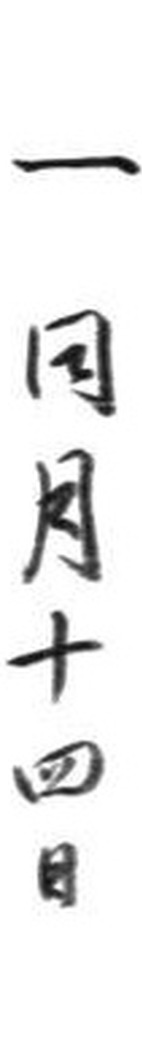一同月十四日
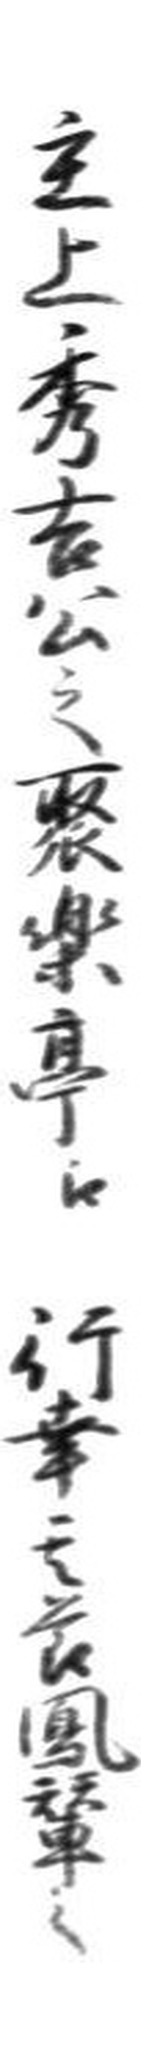主上秀吉公之聚楽亭江行幸其節鳳輦之
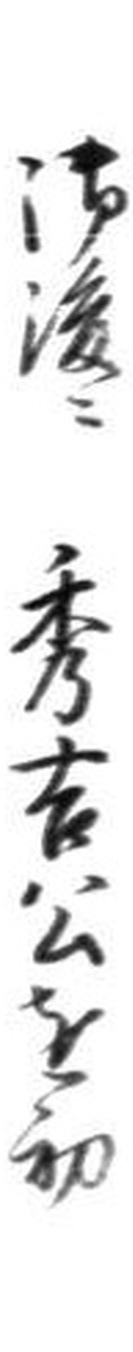御後に秀吉公を初
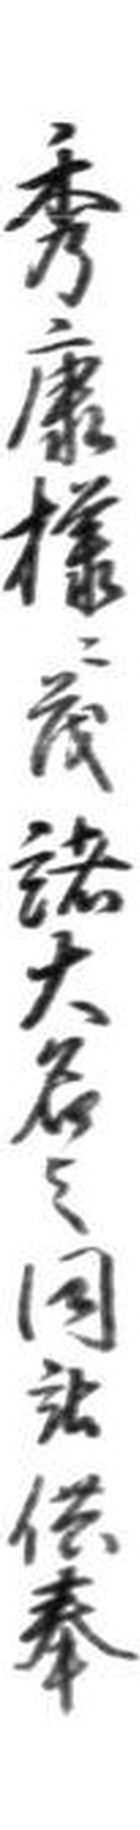秀康様にも諸大名と同被供奉
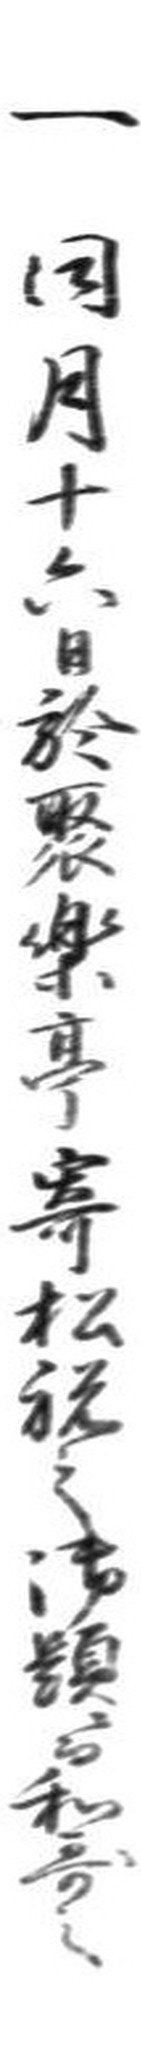一同月十六日於聚楽亭寄松祝之御題に而和歌之
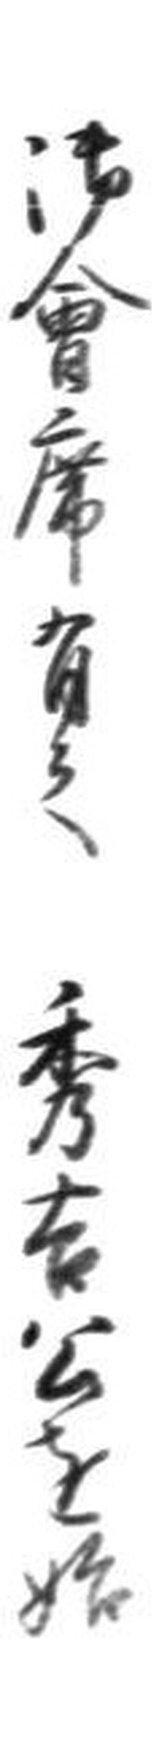御会席有之秀吉公を始

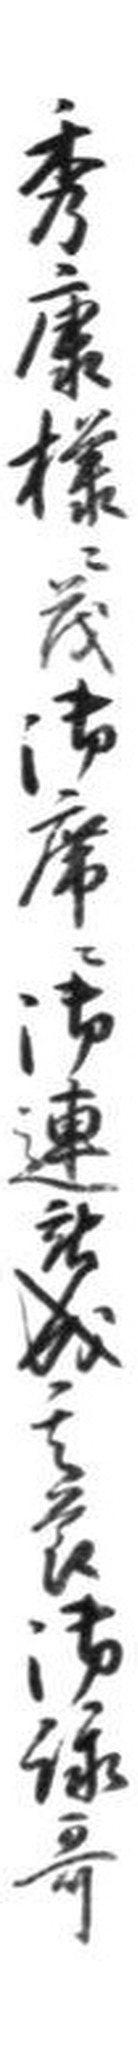秀康様にも御席に御連被成其節御詠歌
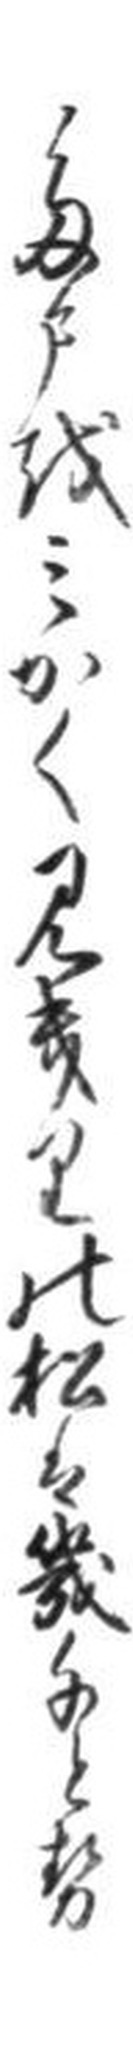たまをみかくみきりの松は幾千とせ
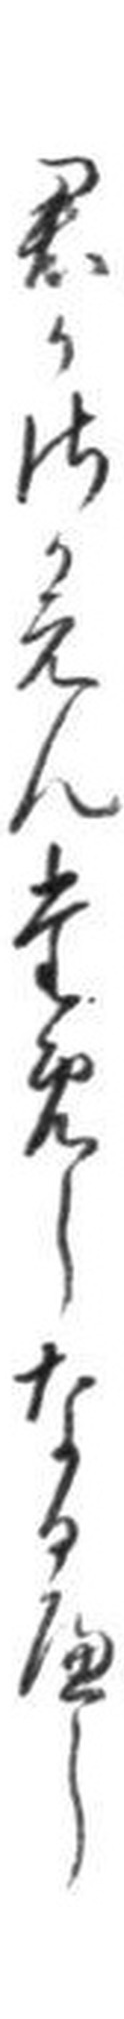君かさかえんためしなるへし
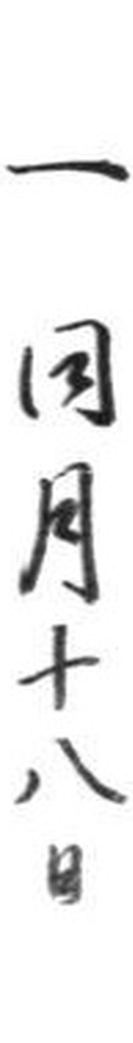一同月十八日
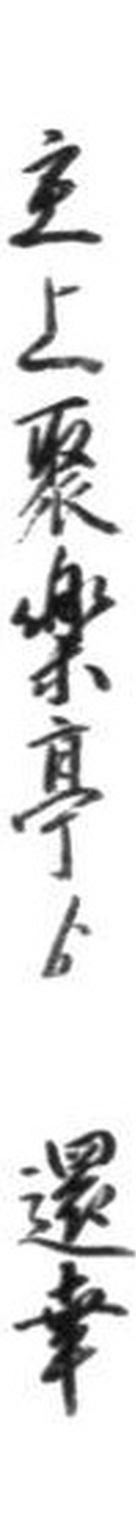主上聚楽亭ゟ還幸
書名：家譜 一 秀康公 従天正二年到慶長十二年
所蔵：福井県文書館 Fukui Prefectural Archives
